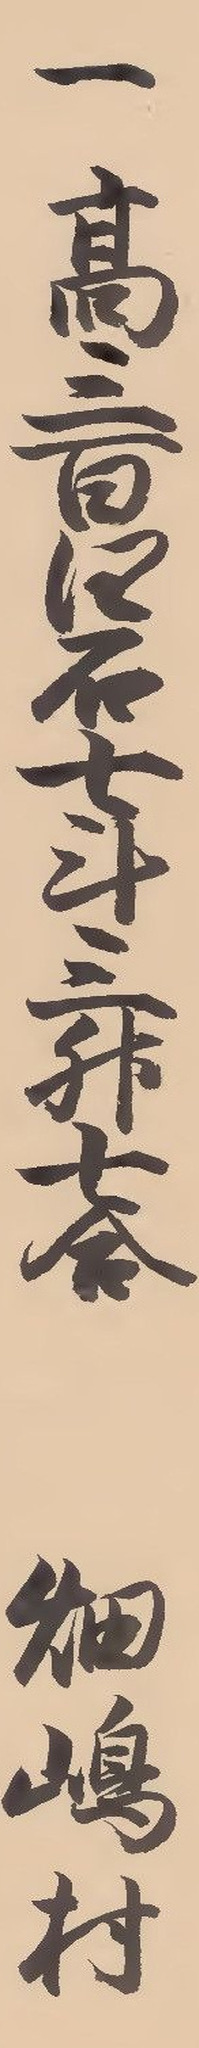一高三百四石七斗三升七合畑島村
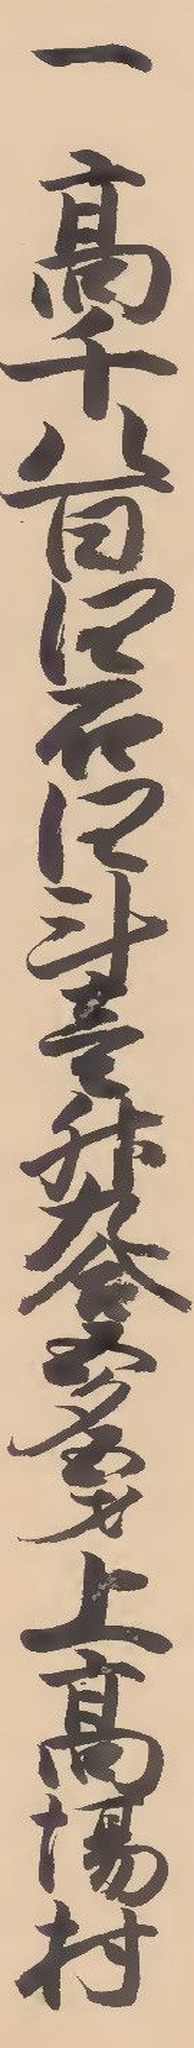一高千八百四石四斗壱升九合五勺五才上高場村

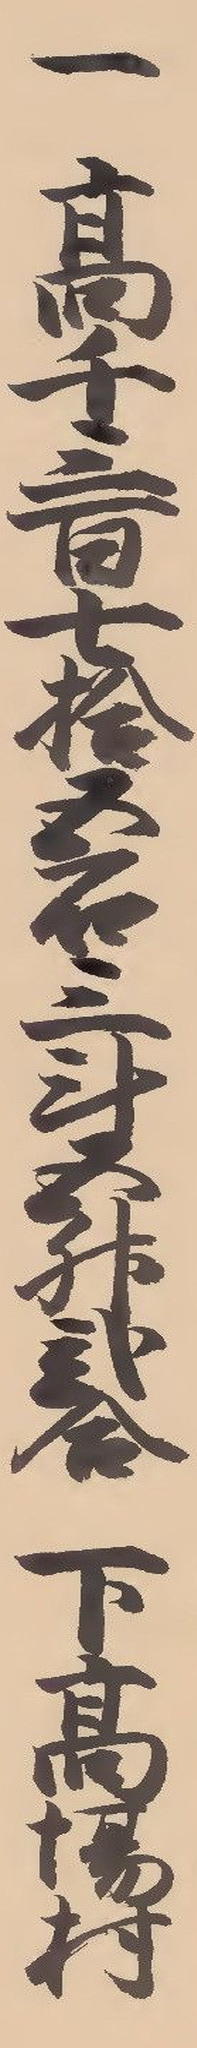一高千三百七拾五石三斗五升弐合下高場村
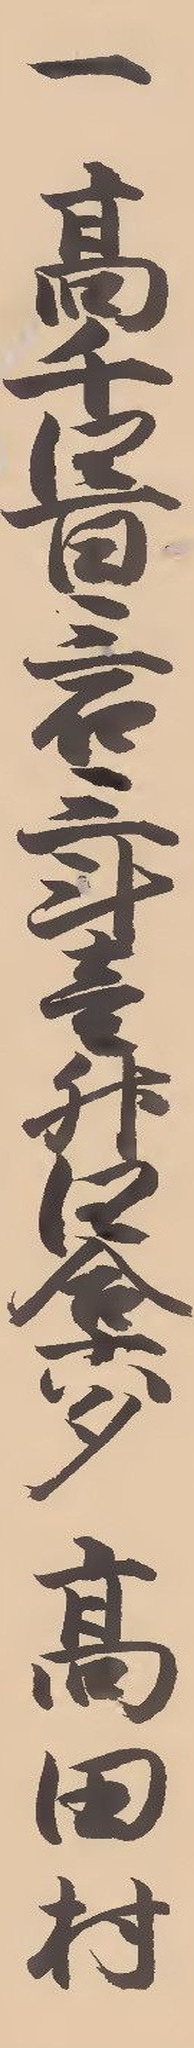一高千四百三石三斗壱升四合六勺高田村
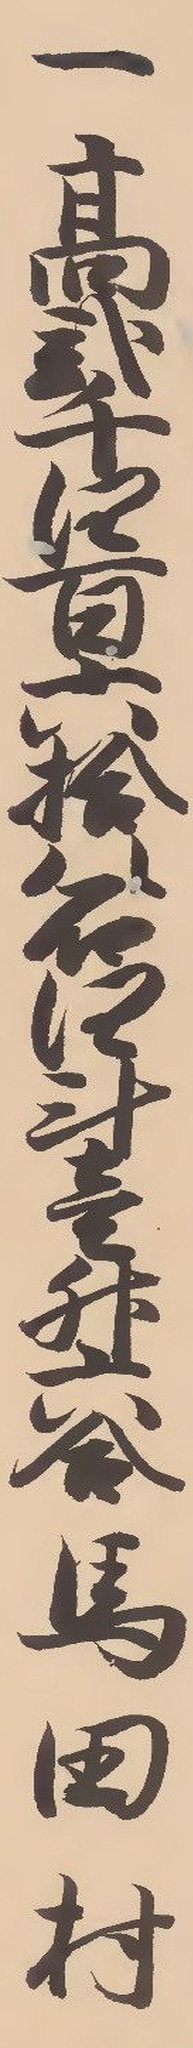一高弐千四百六拾八石四斗壱升六合馬田村
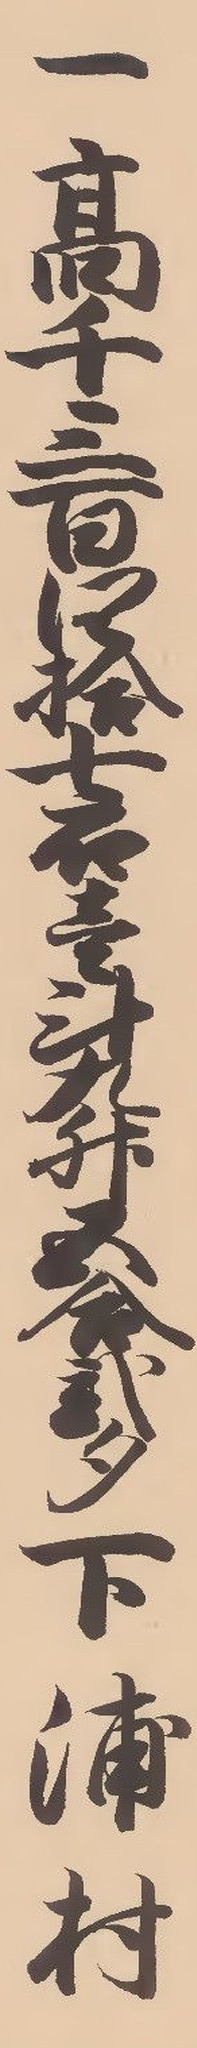一高千三百四拾七石壱斗九升五合弐勺下浦村
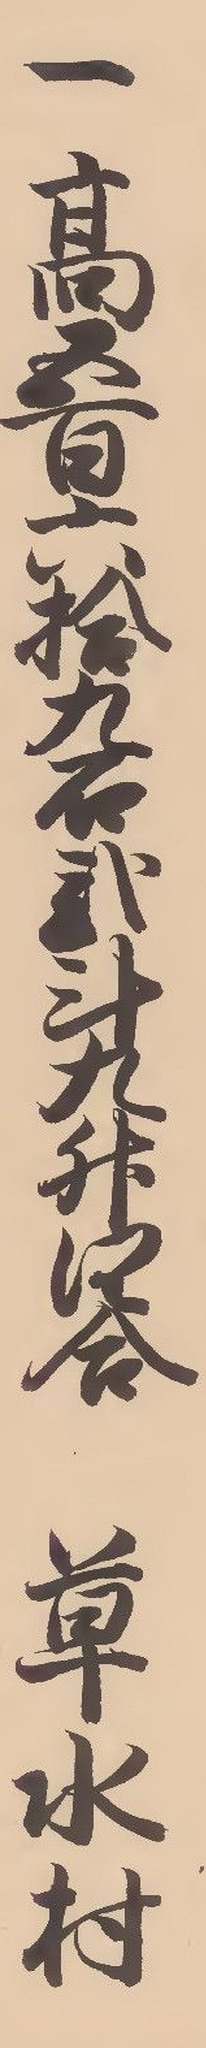一高五百六拾九石弐斗九升四合草水村

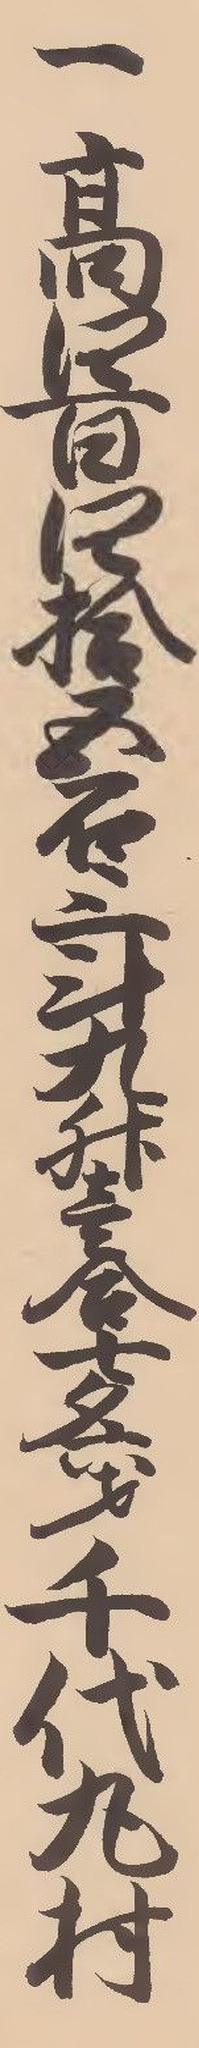一高四百四拾五石三斗九升壱合七勺六才千代丸村
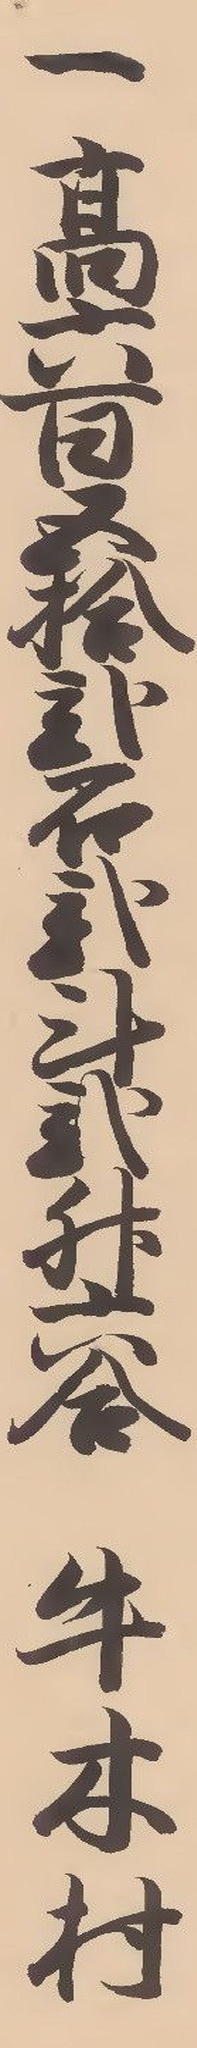一高六百五拾弐石弐斗弐升六合牛木村
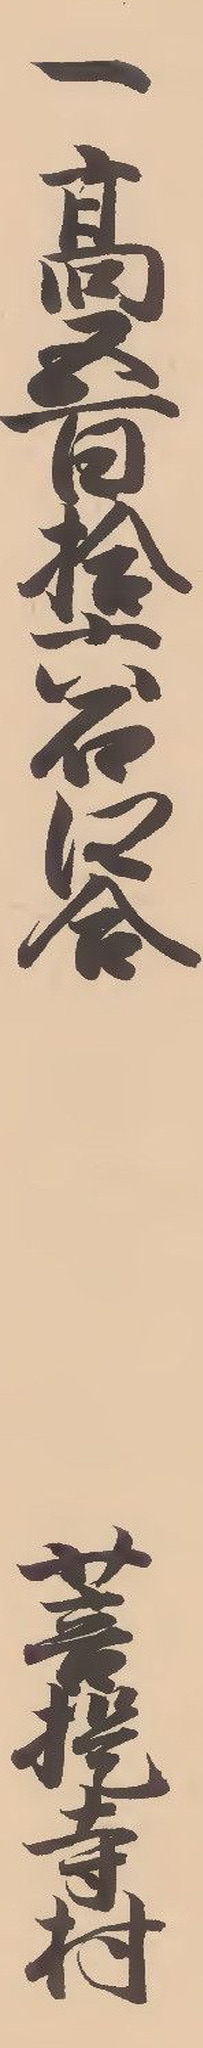一高五百拾六石四合菩提寺村
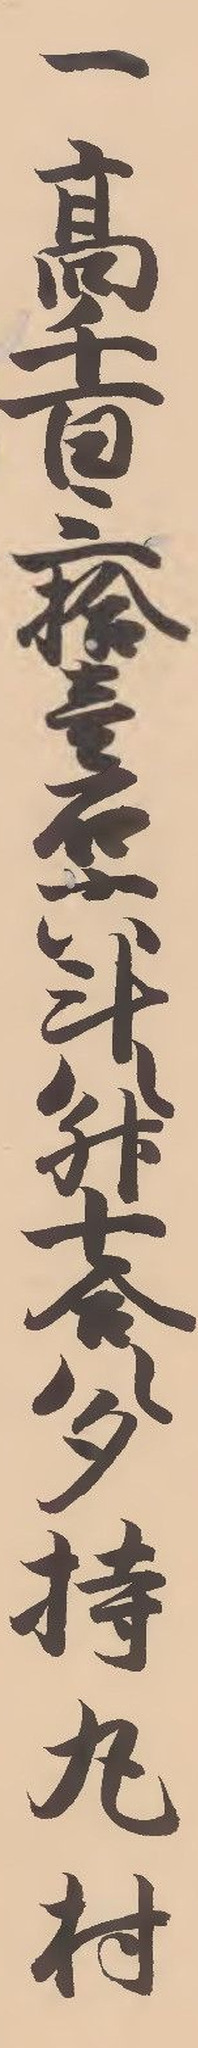一高千百三拾壱石六斗八升七合八勺持丸村
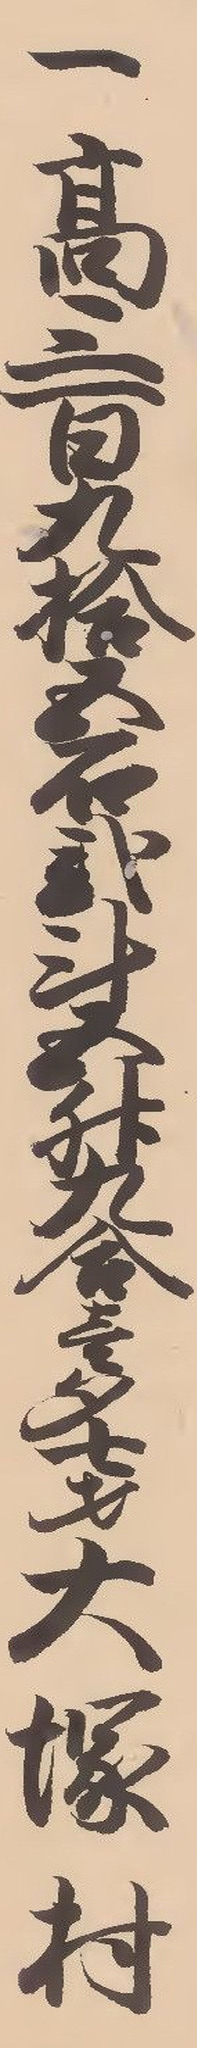一高三百九拾五石弐斗五升九合壱勺七才大塚村
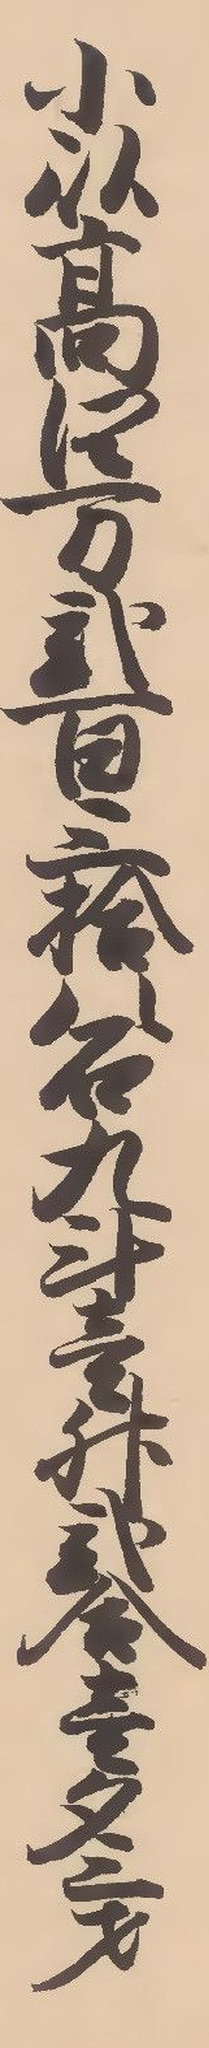小以高四万弐百三拾八石九斗壱升弐合壱勺三才

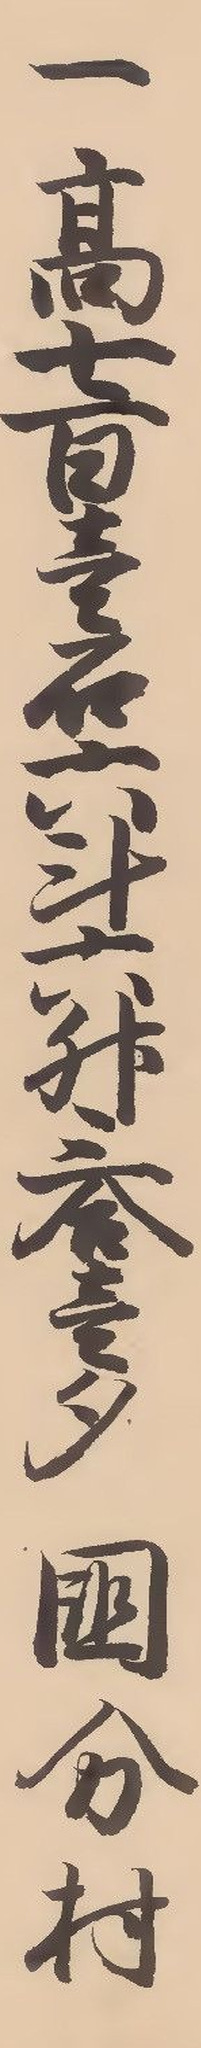一高七百壱石六斗六升三合壱勺国分村
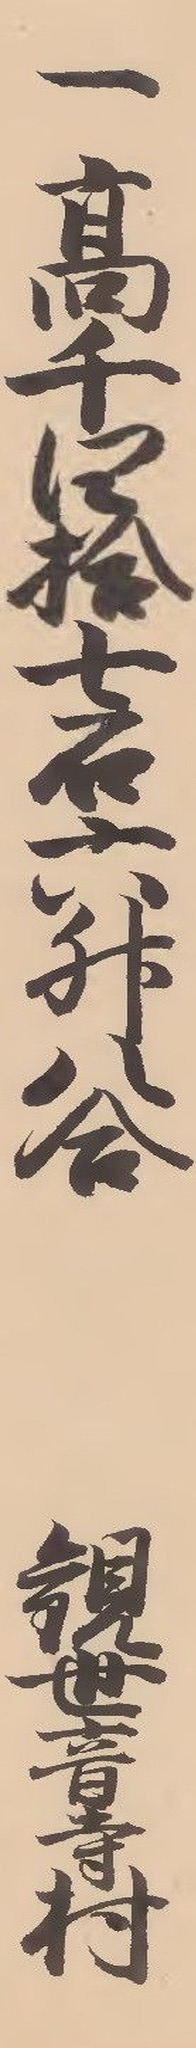一高千四拾七石六升八合観世音寺村
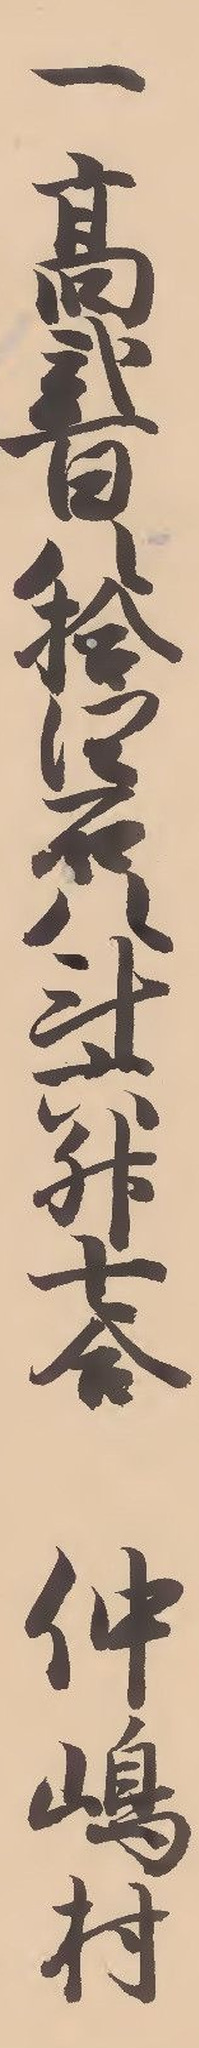一高弐百八拾四石八斗六升七合仲島村
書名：筑前国郷帳
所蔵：国立公文書館 National Archives of Japan
